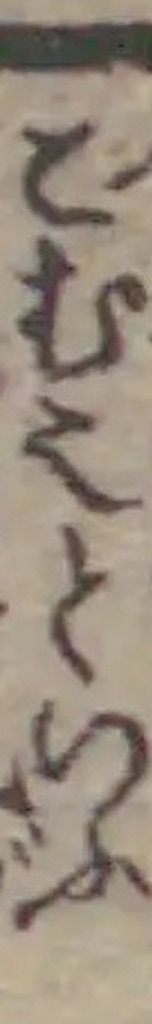こむ也といふ
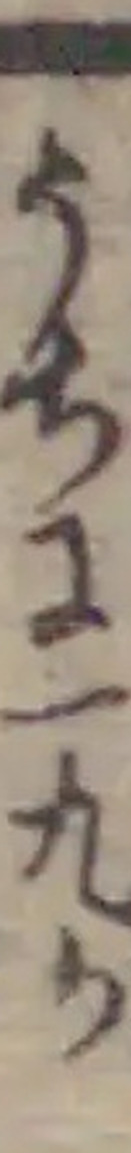うちに一九が
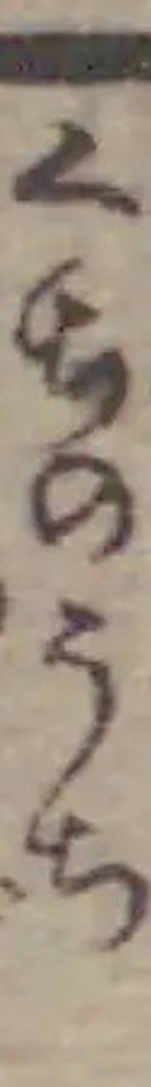くちのうち
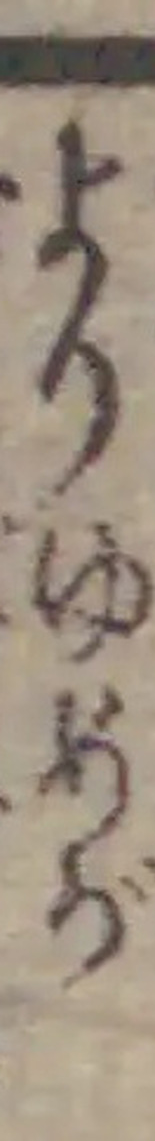よりゆめが
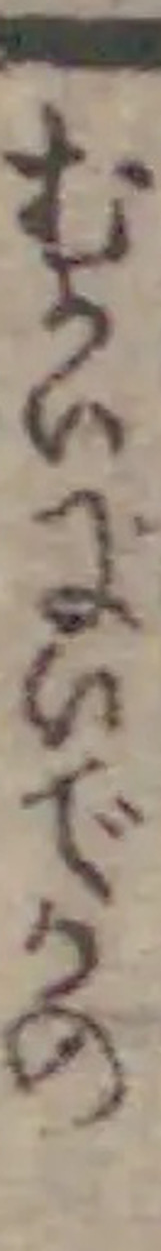むかいにいでかの
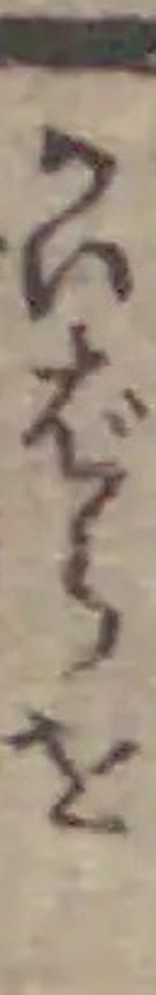かいばらを
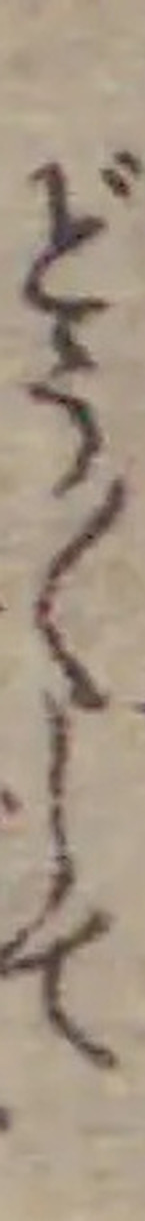どう〳〵して
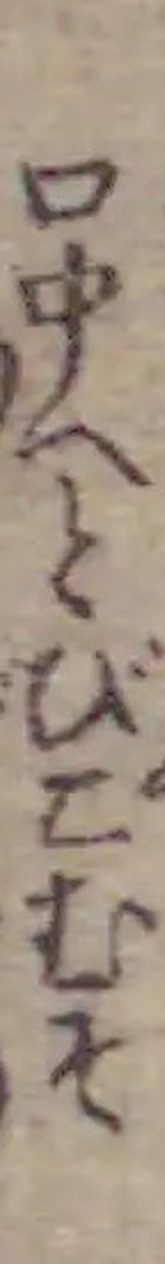口中へとびこむそ
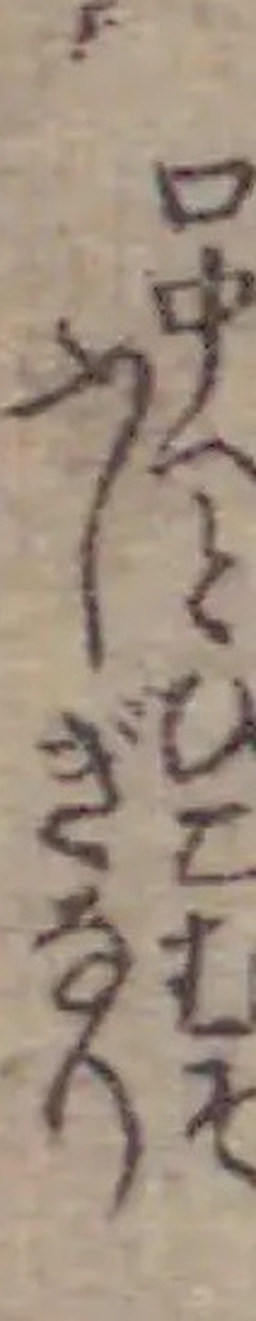ふしぎなり

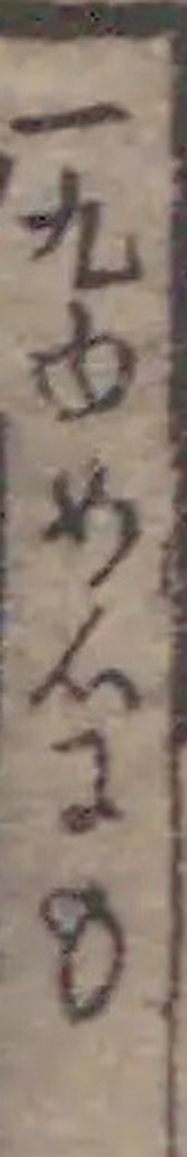一九ゆめ心にも
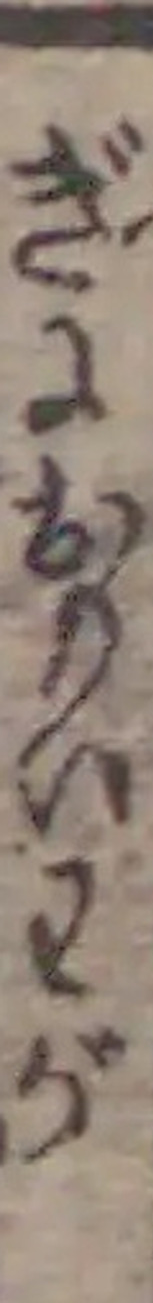ぎにおもいわが
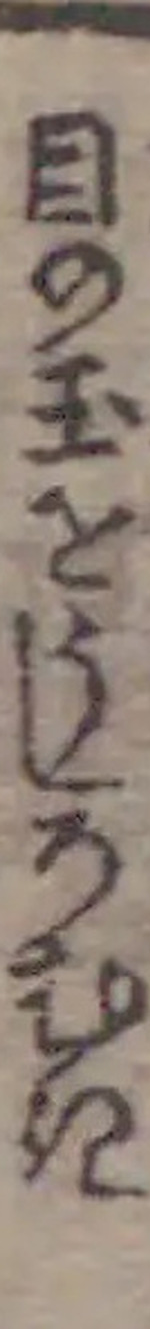目の玉をうしろむき
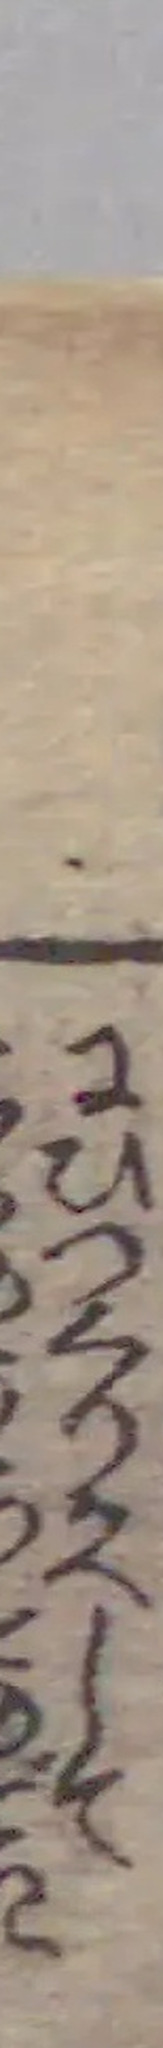にひつくりかへして
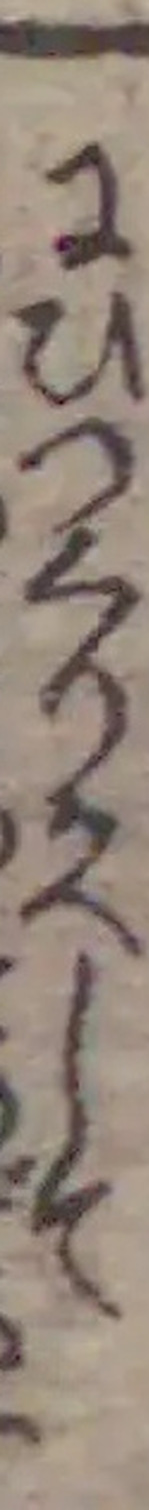にひつくりかへして
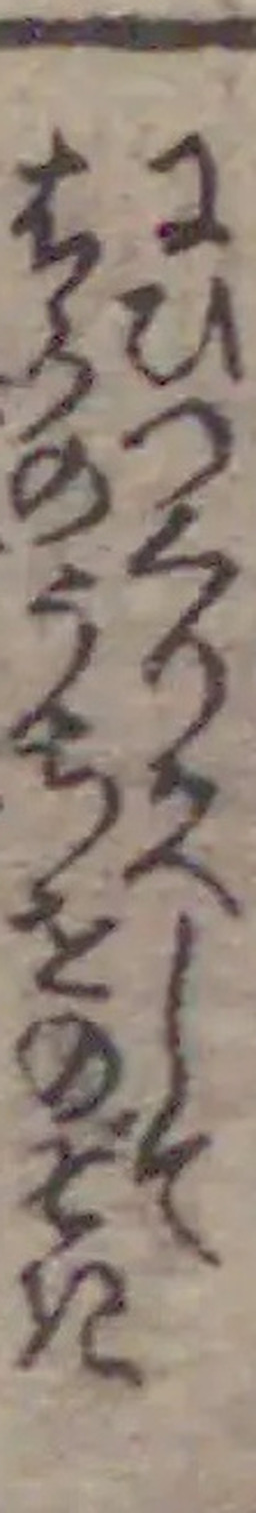はらのうちをのぞき
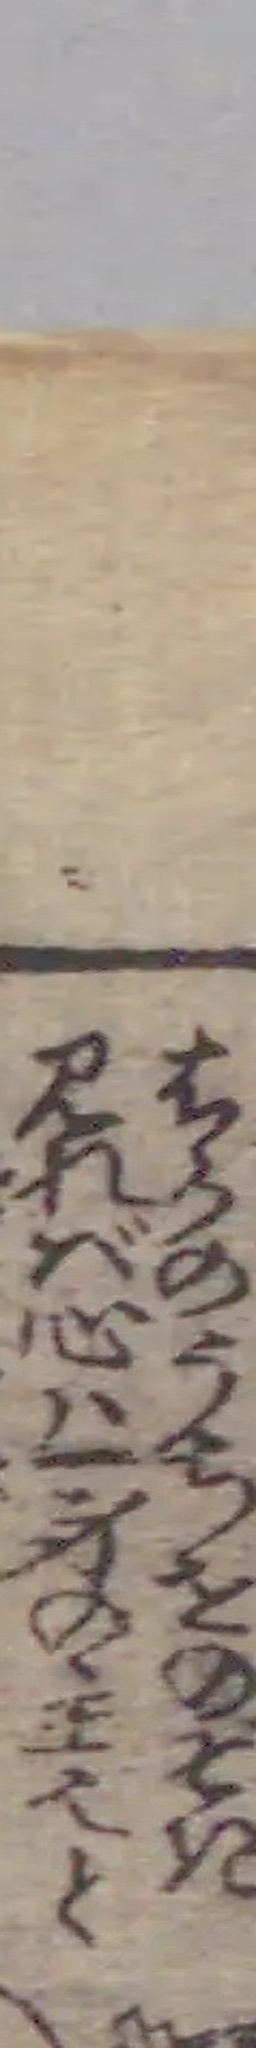見れば心は一身の主也と
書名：腹内養生主論 3巻
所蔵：国立国会図書館 National Diet Library, JAPAN
